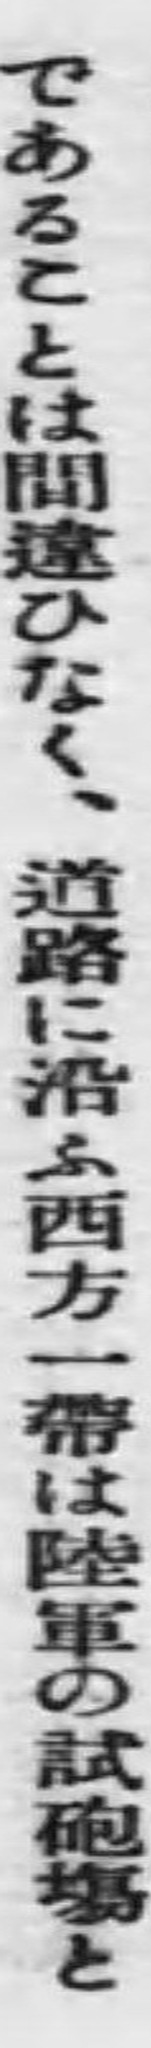であることは間違ひなく、道路に沿ふ西方一帯は陸軍の試砲場と
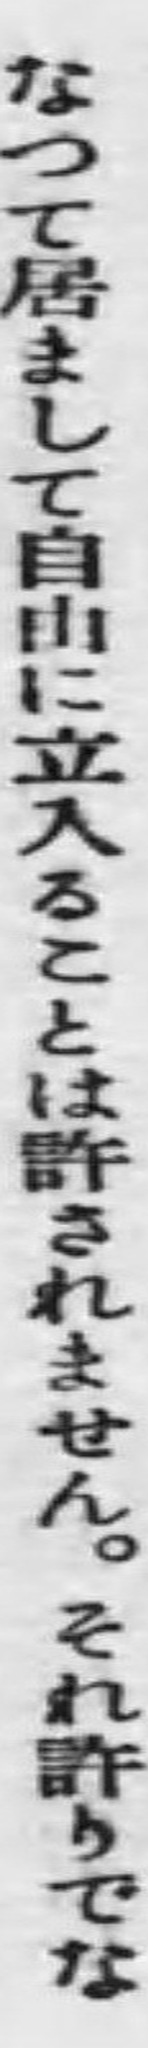なつて居まして自由に立入ることは許されません。それ許りでな
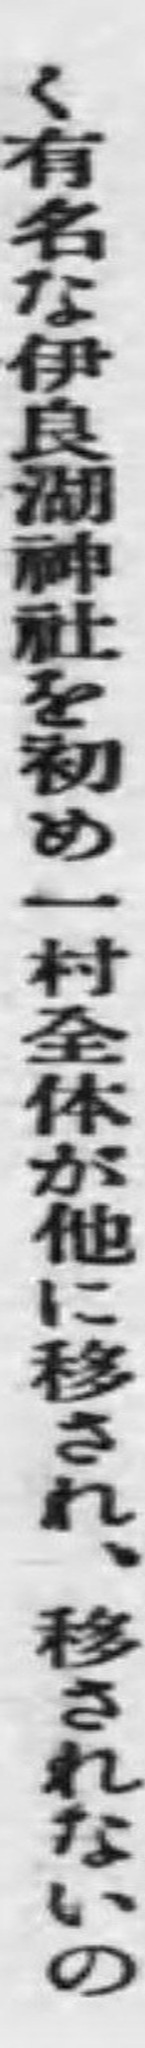く有名な伊良湖神社を初め一村全体が他に移され、移されないの
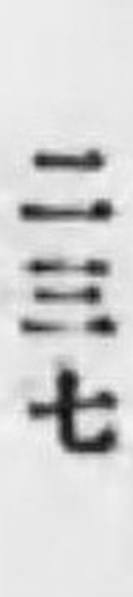二三七

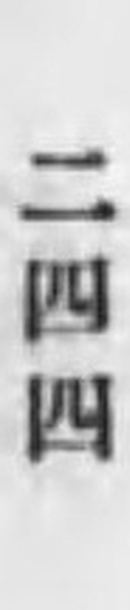二四四
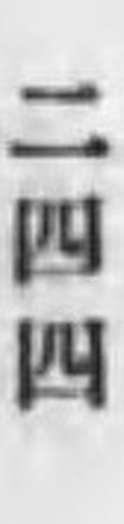二四四
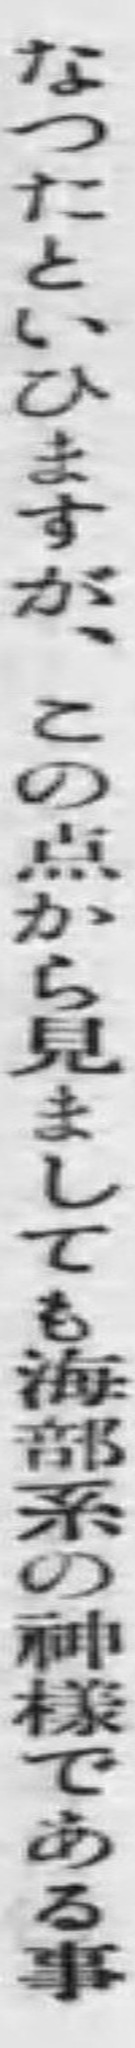なつたといひますが、この点から見ましても海部系の神様である事
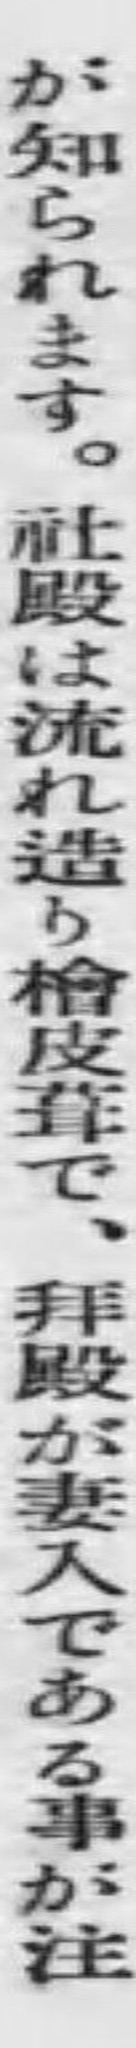が知られます。社殿は流れ造り檜皮葺で、拝殿が妻入である事が注
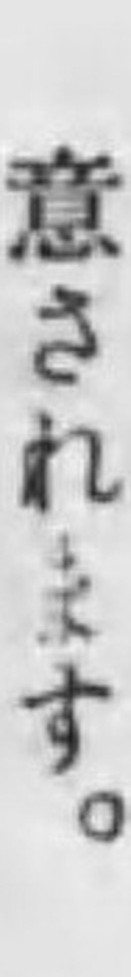意されます。
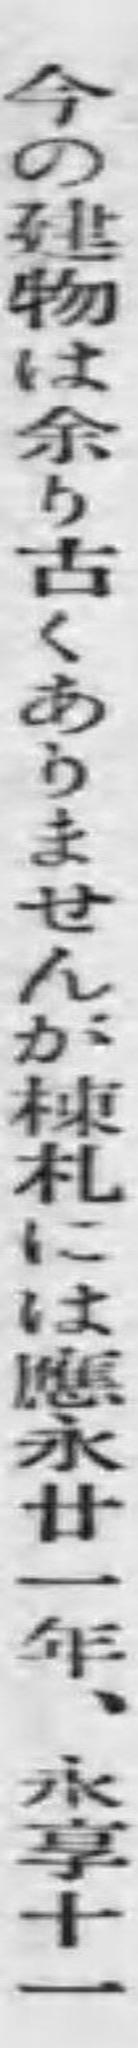今の建物は余り古くありませんが棟札には応永廿一年、永享十一
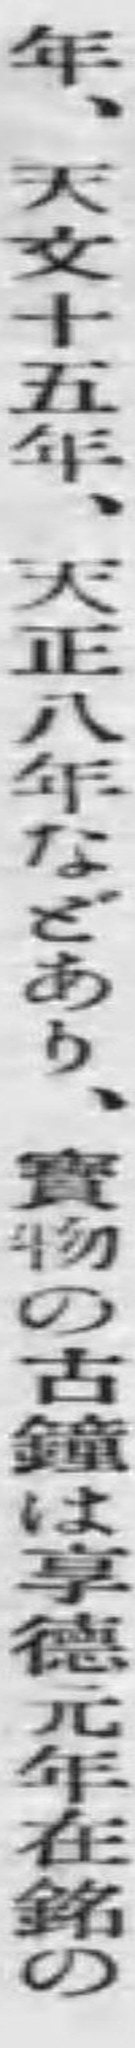年、天文十五年、天正八年などあり、宝物の古鐘は享徳元年在銘の
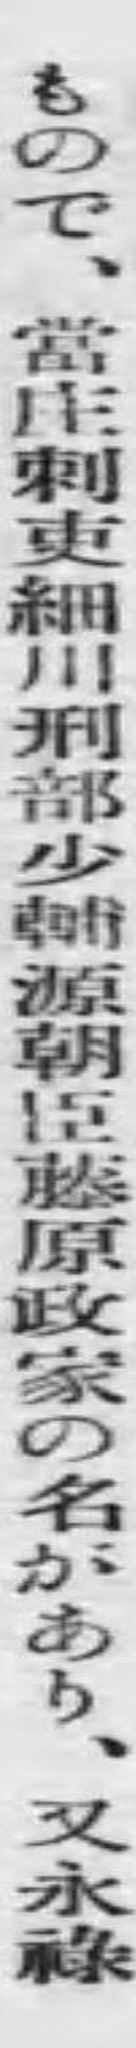もので、当庄刺吏細川刑部少輔源朝臣藤原政家の名があり、又永禄
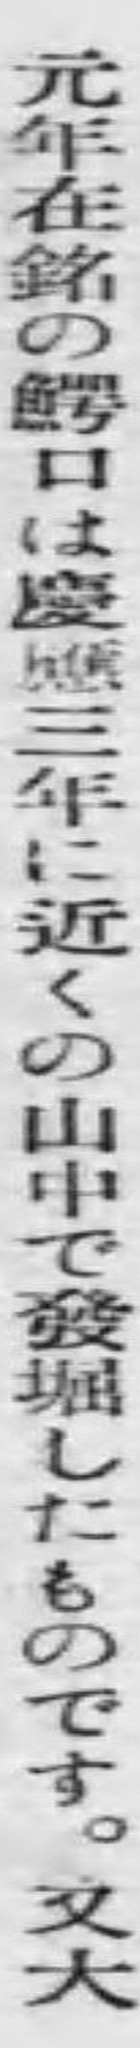元年在銘の鰐口は慶応三年に近くの山中で発堀したものです。又大
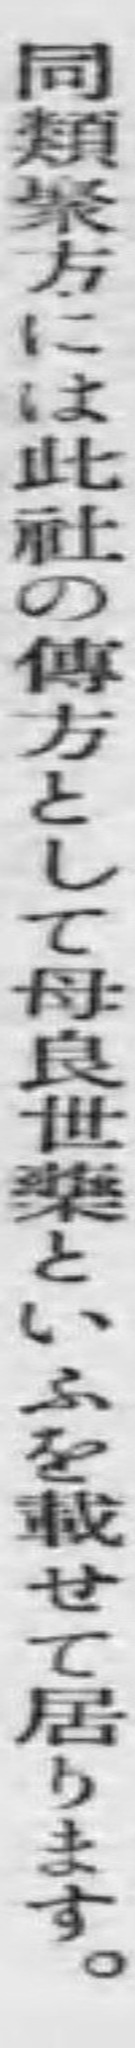同類聚方には此社の伝方として母良世薬といふを載せて居ります。
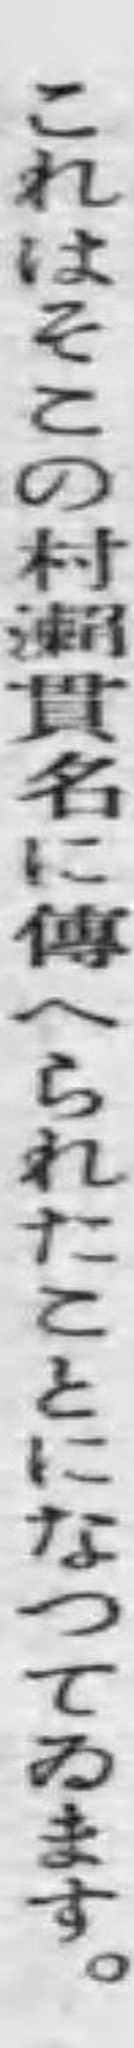これはそこの村瀬貫名に伝へられたことになつてゐます。
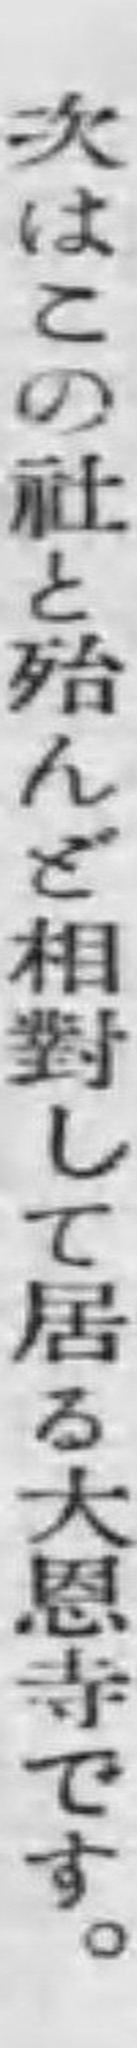次はこの社と殆んど相対して居る大恩寺です。
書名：東三河道中記 : 豊橋市及其附近案内
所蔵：国立国会図書館 National Diet Library, JAPAN
